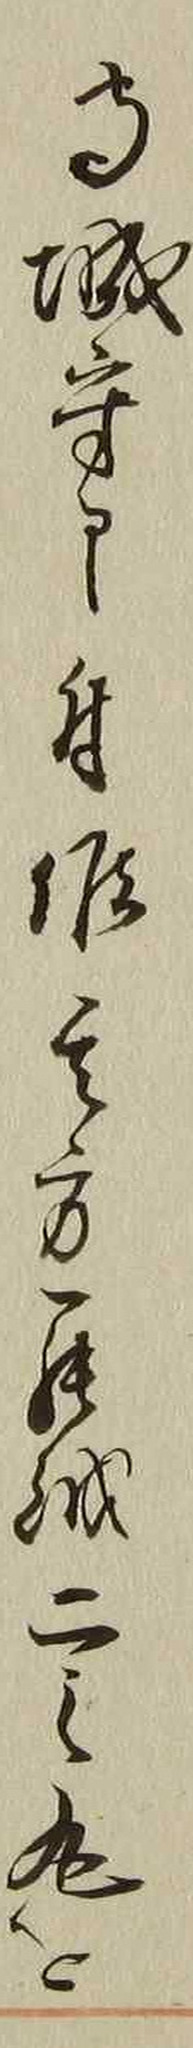守城守申付候其方罷越二之丸を
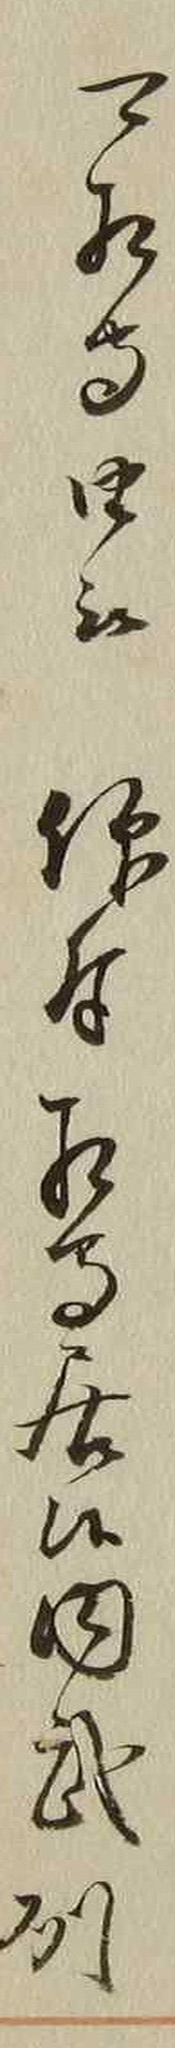可相守由被仰付相守居候内武州
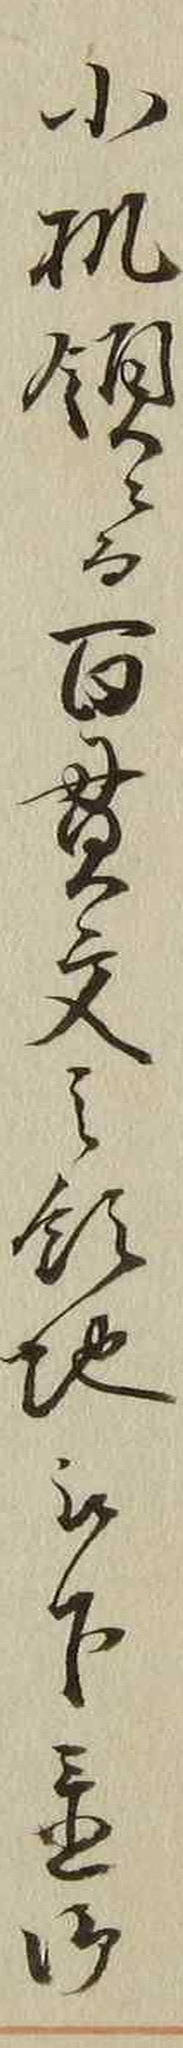小机領ニ而百貫文之領地被下置御
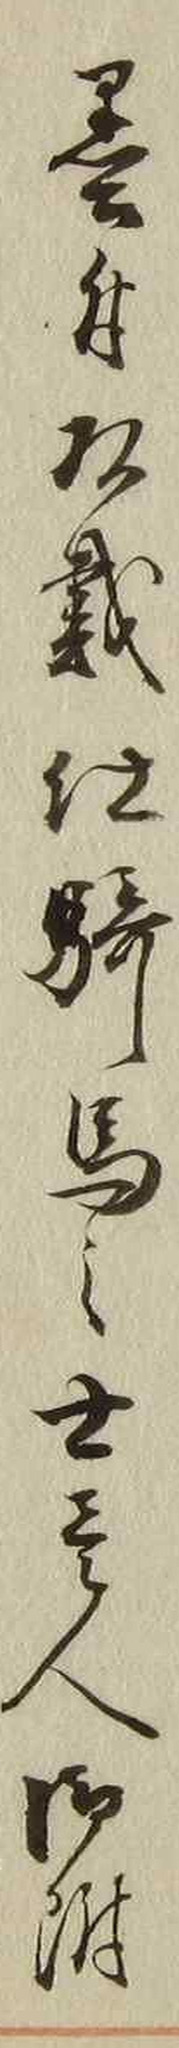墨付頂戴仕騎馬之士壱人御附
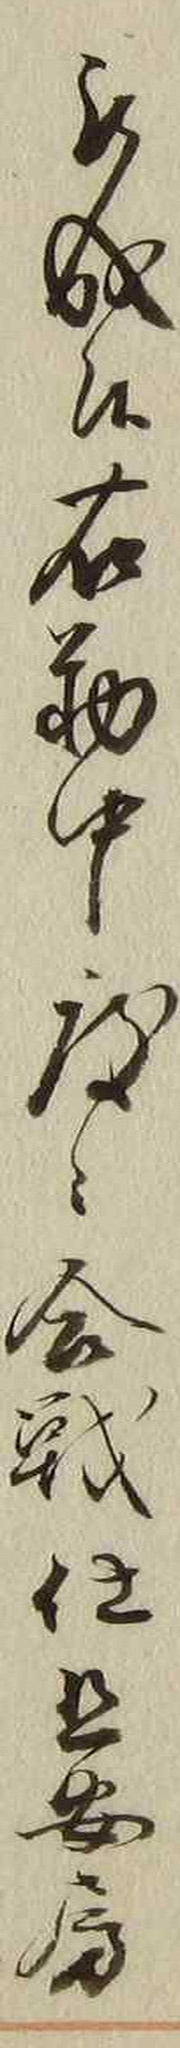被成候右勤中度々合戦仕且安房
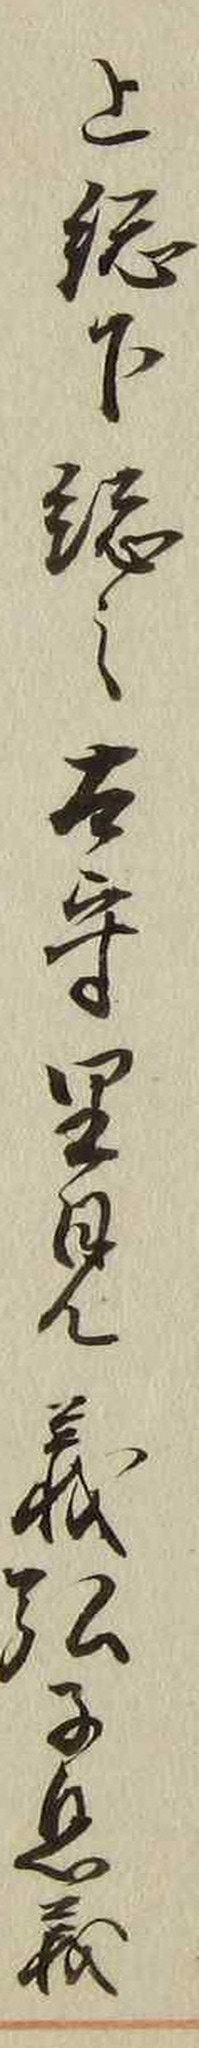上総下総之太守里見義弘子息義
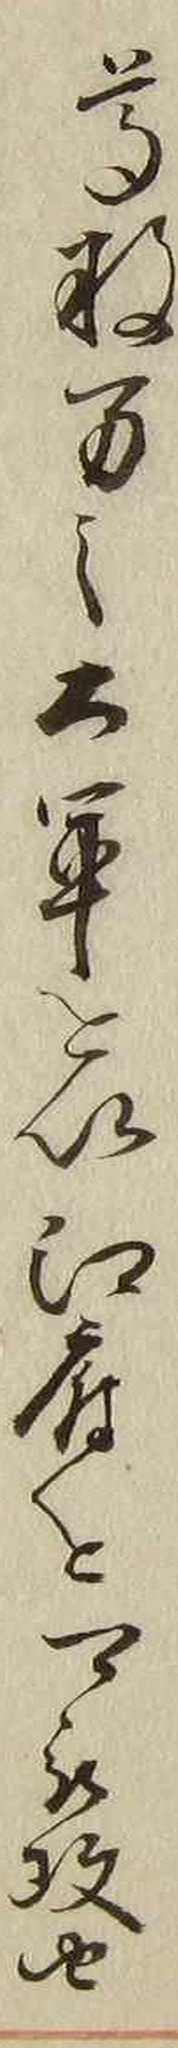尊数万之大軍を以江府を可被攻由
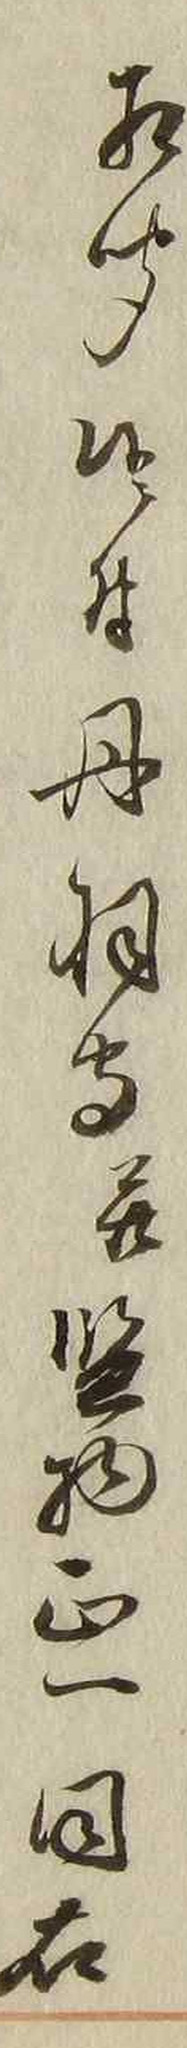相聞候ニ付丹羽守并監物正一同右
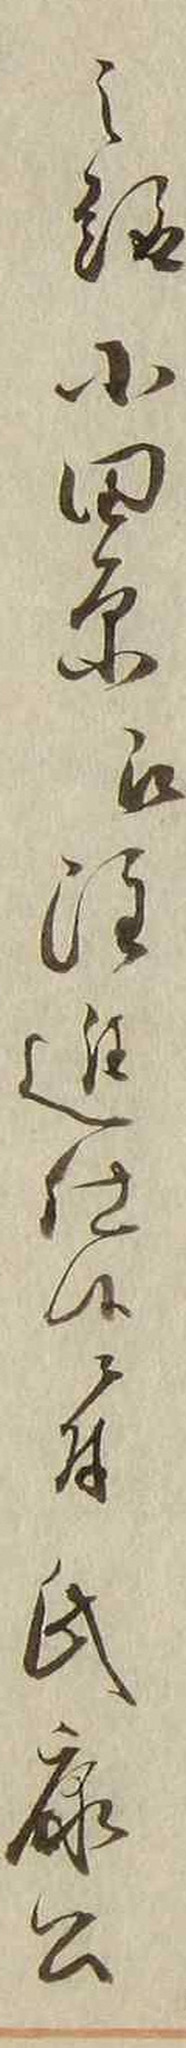之趣小田原江注進仕候付ニ付氏康公
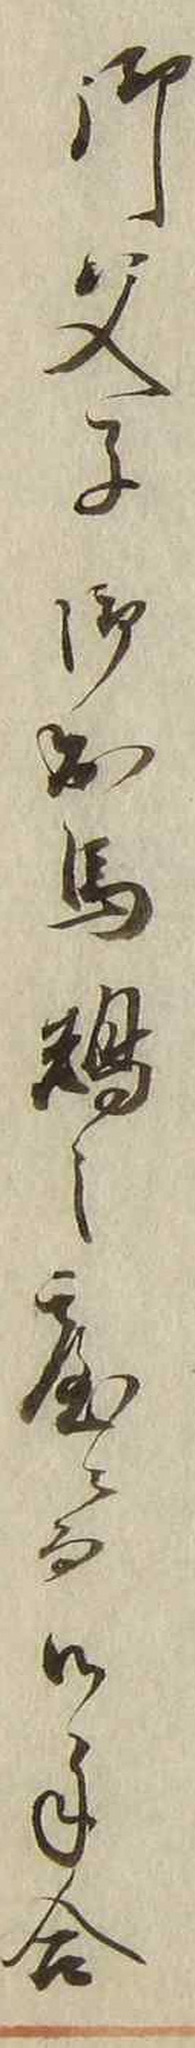御父子御出馬鵠之台ニ而御手合

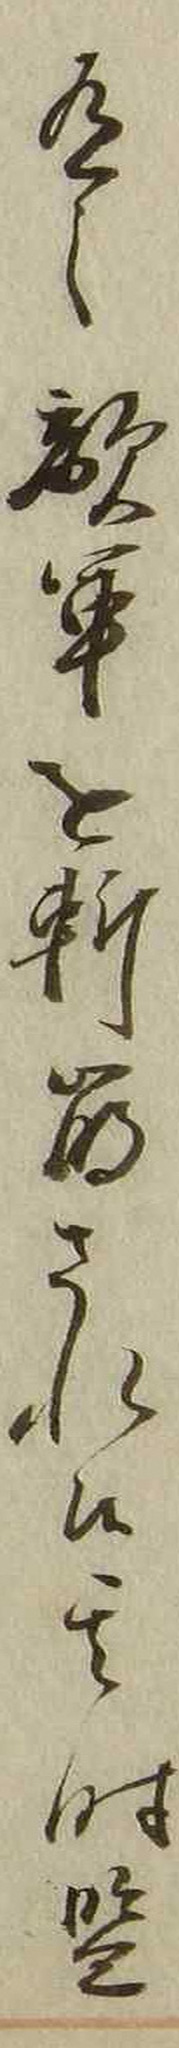有之敵軍を斬崩され候其時監
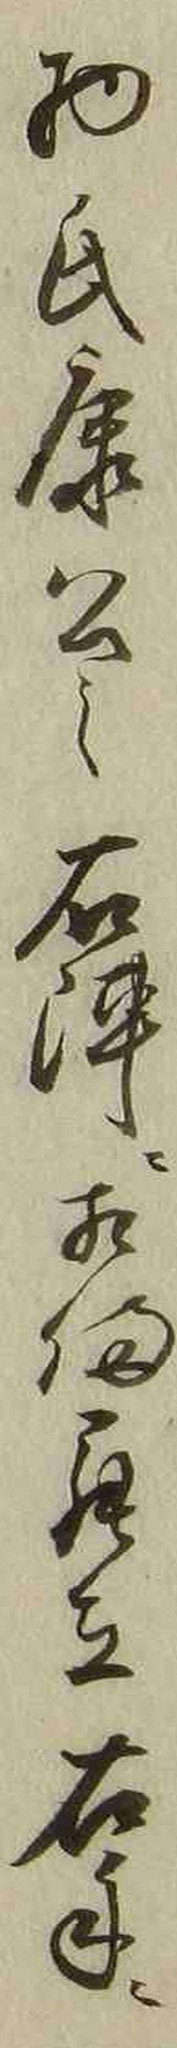物氏康公之右陣ニ相備罷在右手ニ
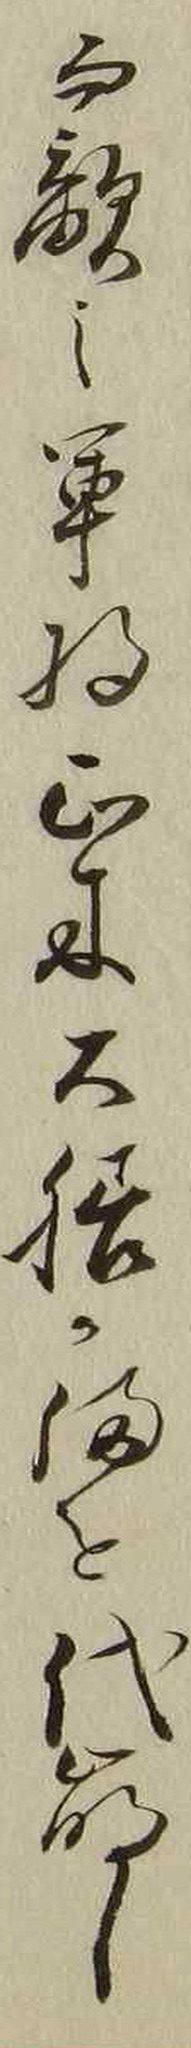而敵之軍将正木大膳か備を伐崩し
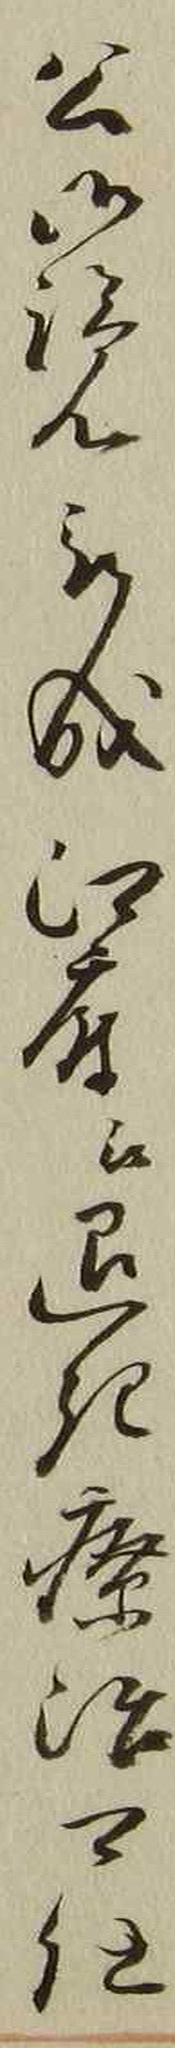公御覧被成江府江退き療治可仕
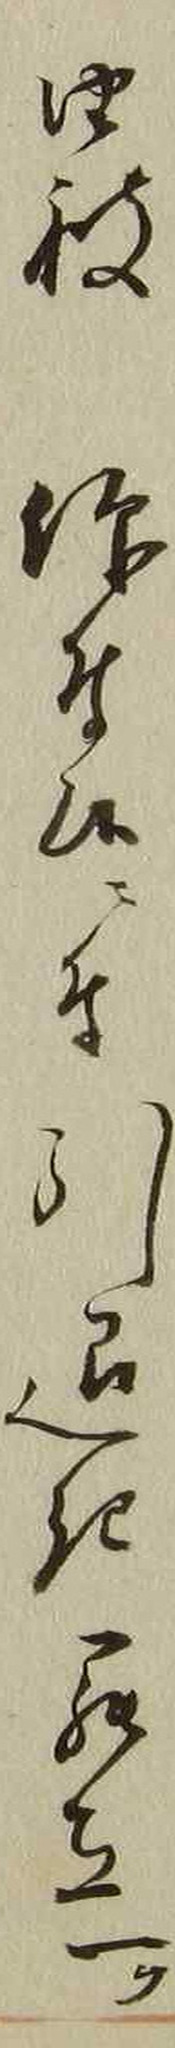由被仰付候ニ付引退き罷在一ヶ
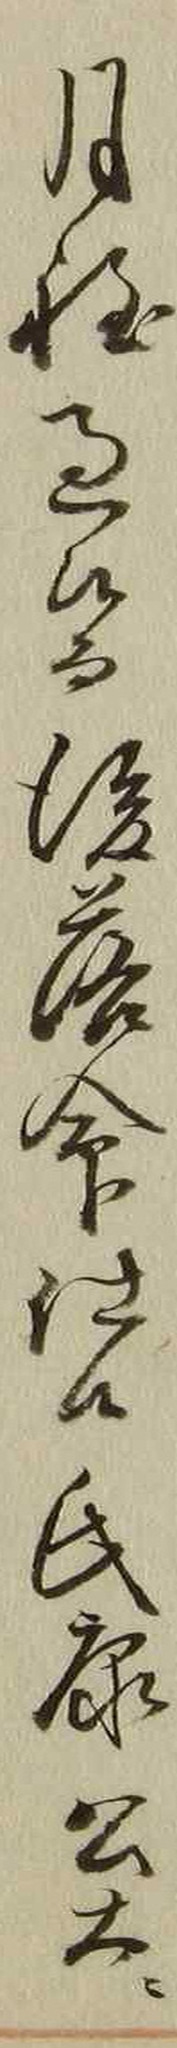月程過候而後落命仕候氏康公大ニ
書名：諸士系譜　巻之122　よ之部5
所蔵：会津若松市立会津図書館
